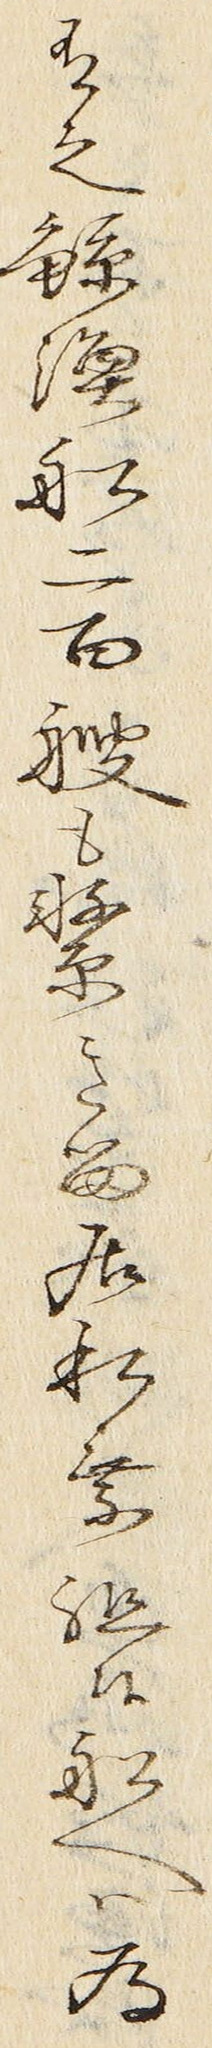有之鯨漁船二百艘も繋き留居私乗組候船へは為
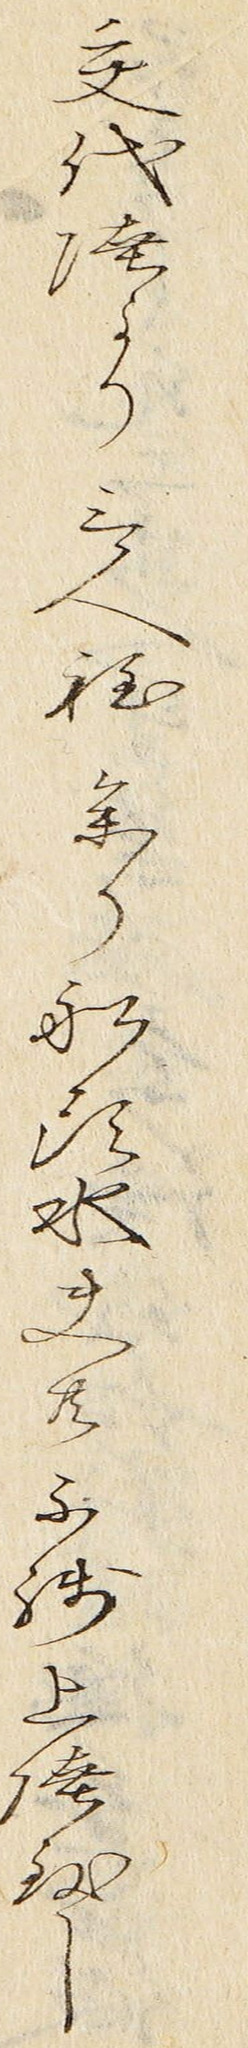交代陸より三人程参り船頭水夫共不残上陸致し
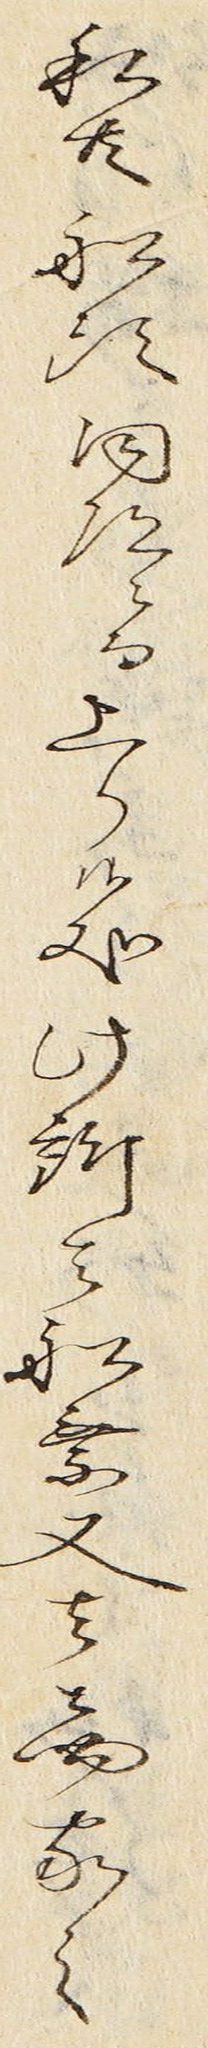私共船頭同道にて上り候処此所は船乗又は商家之
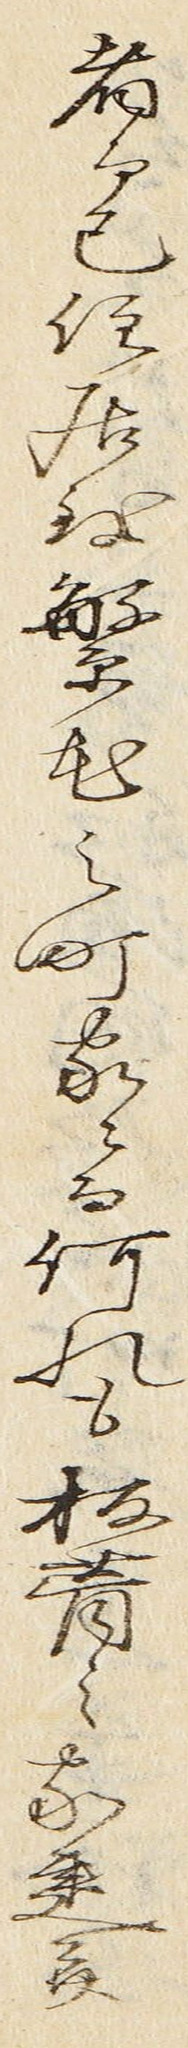者而巳居住致繁花之町家に而何れも板葺之家建具
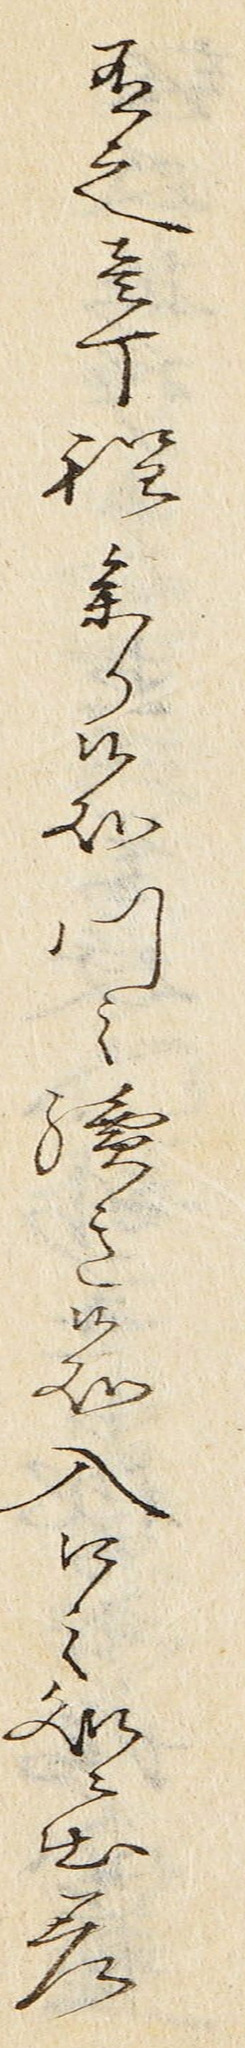有之壱丁程参り候処門之続き候処入口之処に出差
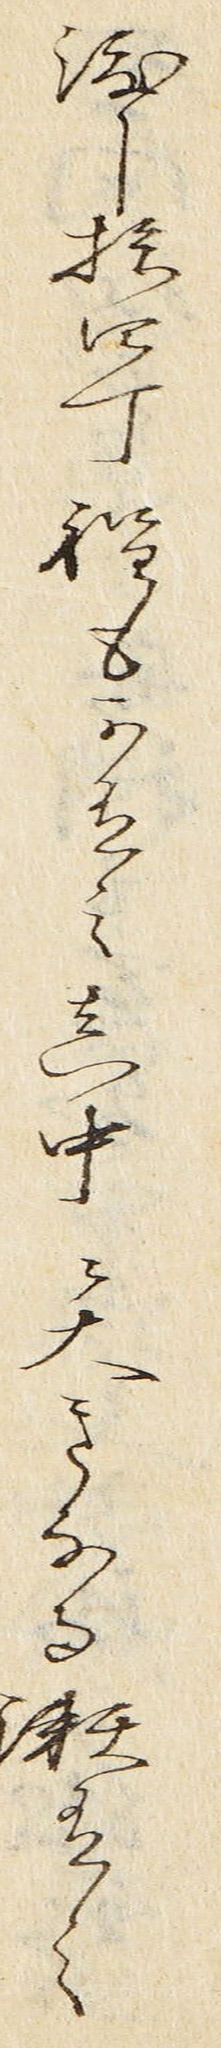渡し拾四丁程も可有之真中に大きなる瀬有之
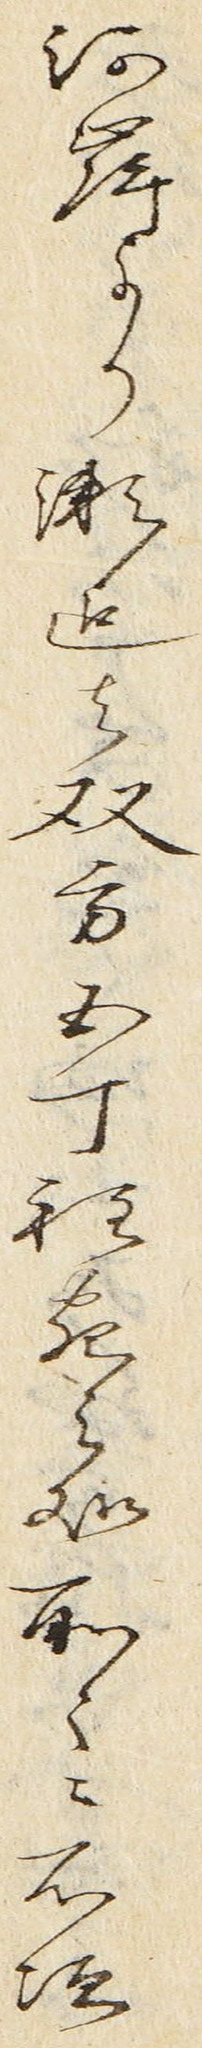河岸より瀬迄は双方五丁程宛之処所々に石垣
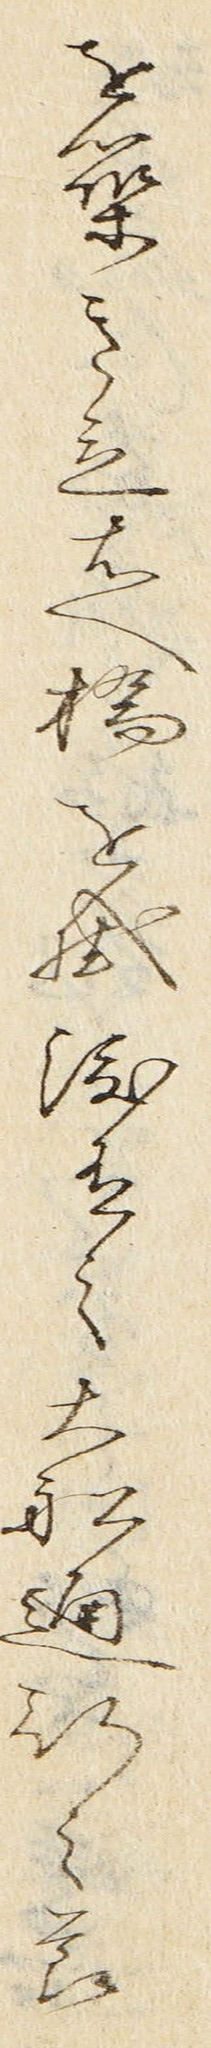を築き立右へ橋を掛渡有之大船通行之節
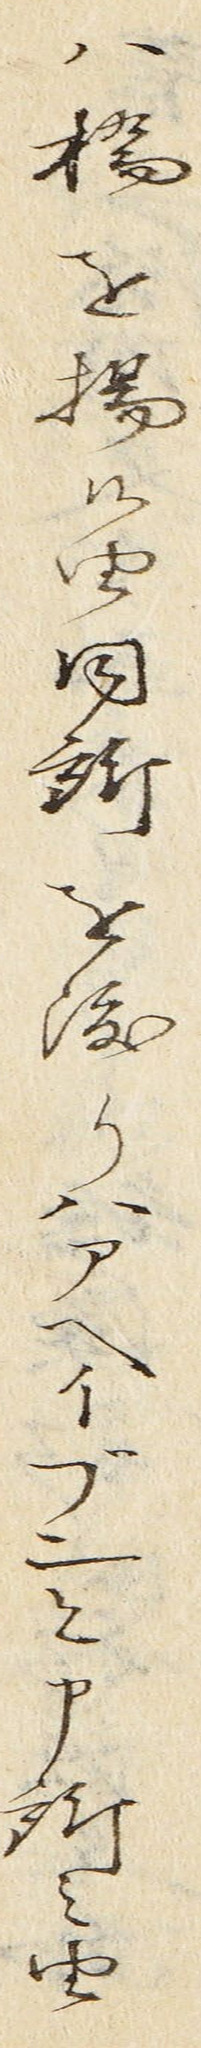は橋を揚候由同所を渡りハアヘイブンと申所之由
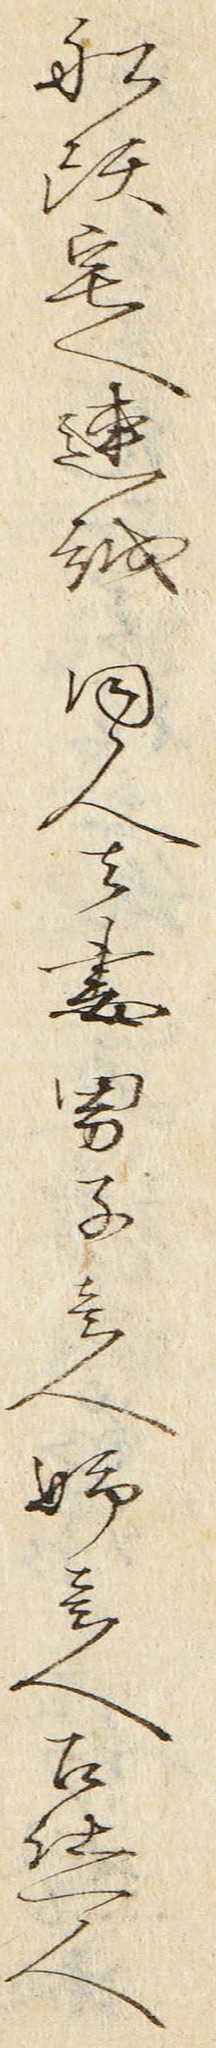船頭宅へ連越同人は妻男子壱人姉壱人召使一人
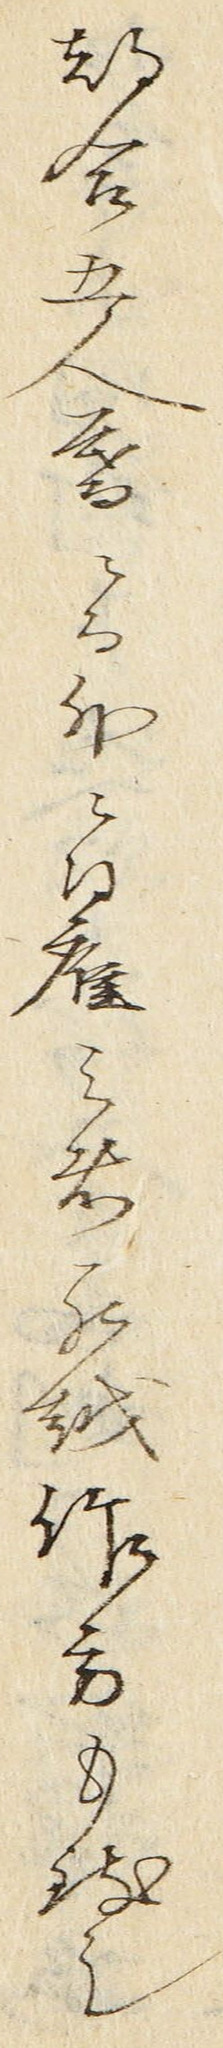都合五人暮に而外に日雇之者罷越作方も致し

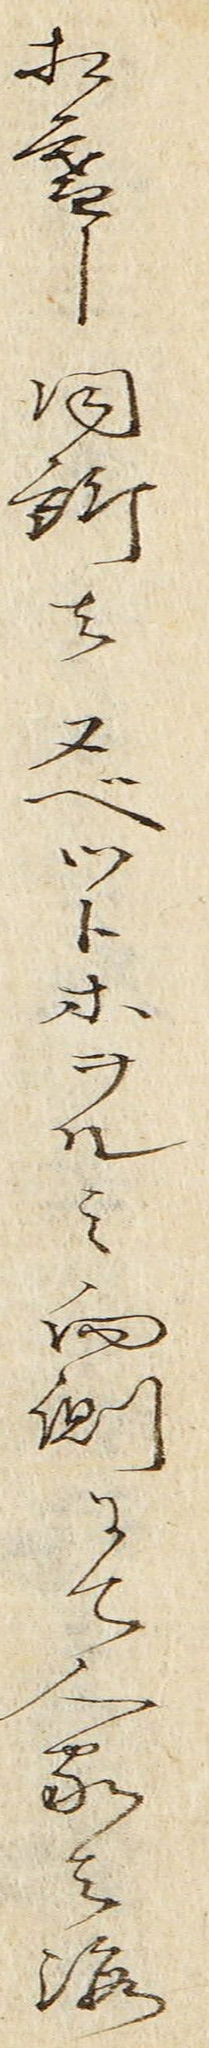相暮し同所はヌベツトホヲル之向側にて人家は海
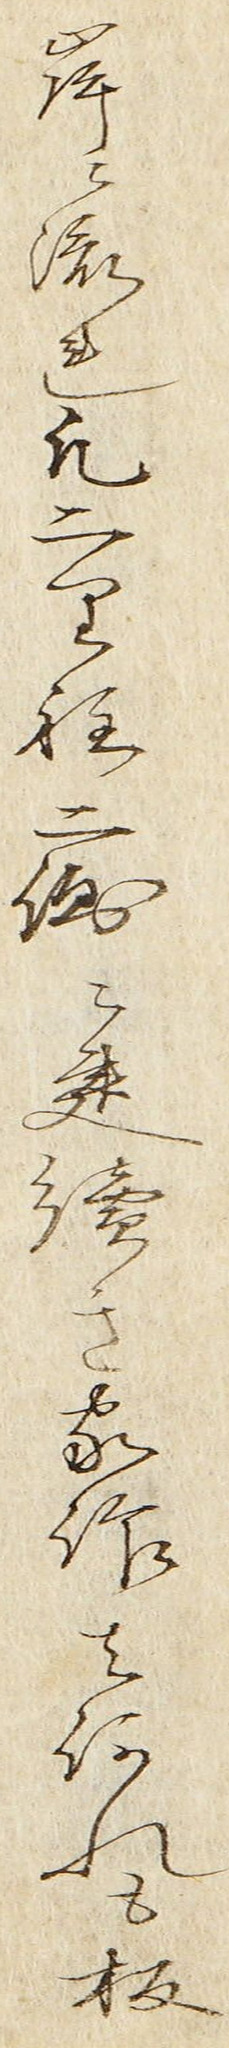岸に流れ凡二里程二側に建続き家作は何れも板
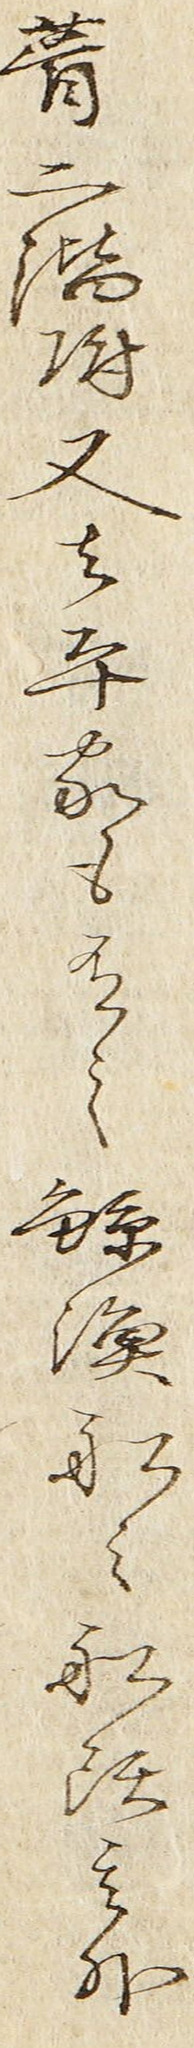葺二階附又は平家も有之鯨漁船之船頭其外
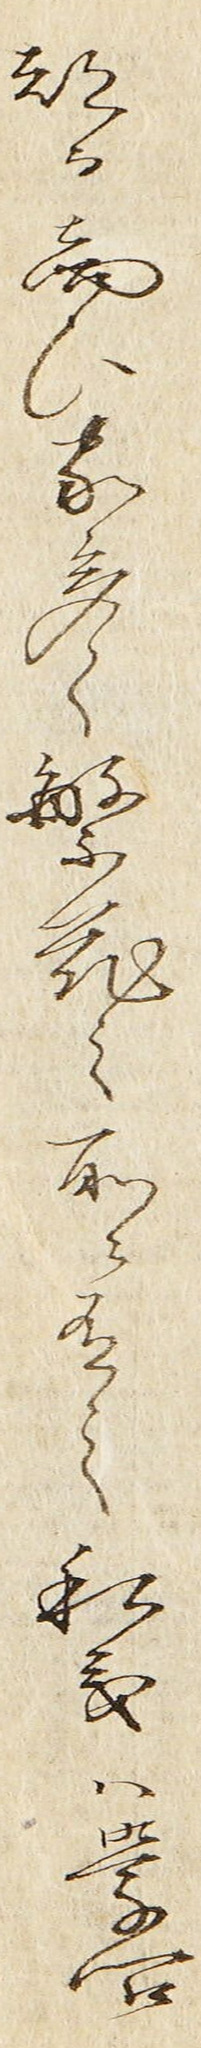都而商ひ家多し繫花之所に有之私義は学問
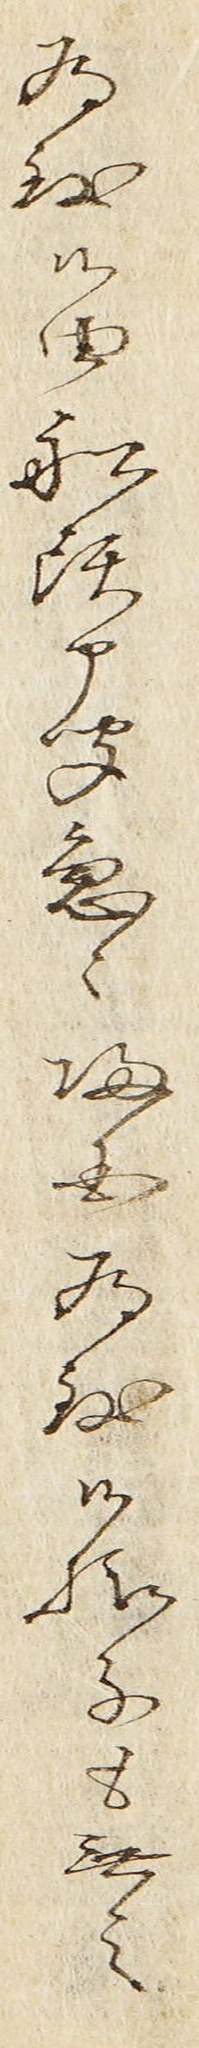為致候由船頭申聞急々帰国為致候様子も無之
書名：土佐中浜万次郎漂流記
